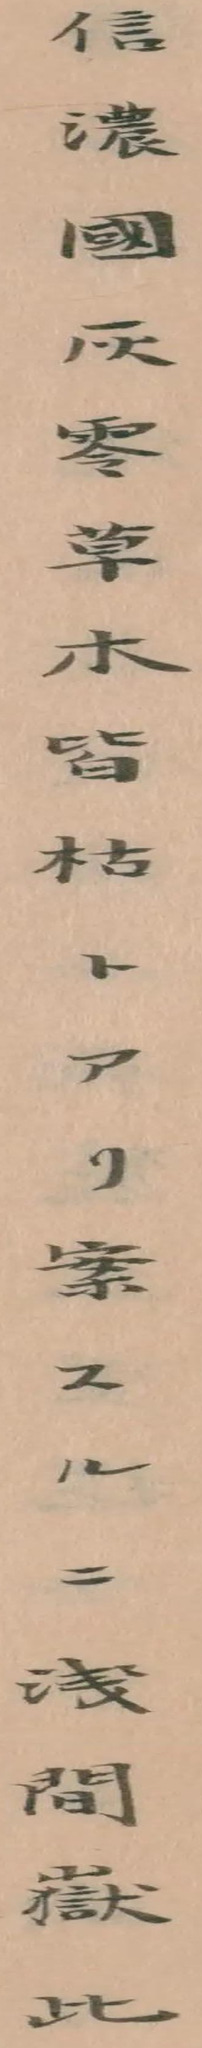信濃国牌灰零草木皆枯トアリ案スルニ浅間嶽此
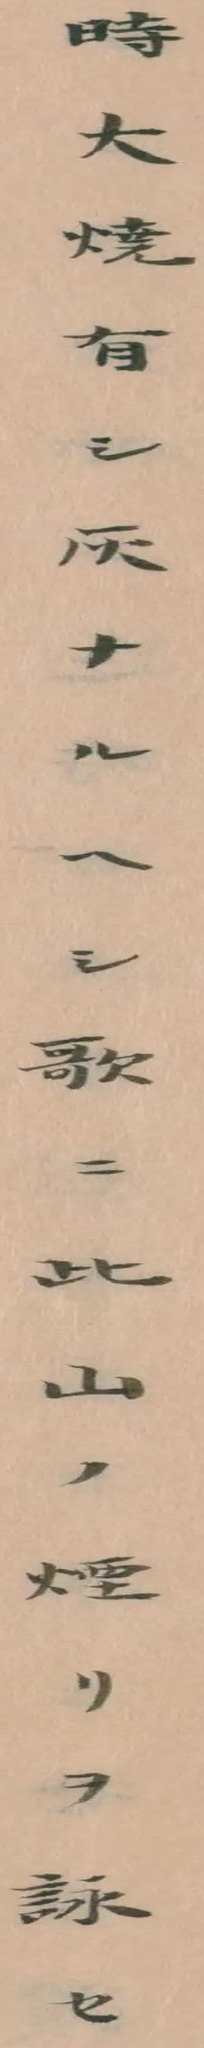時大焼有シ灰ナルへシ歌二此山ノ煙リヲ詠せ
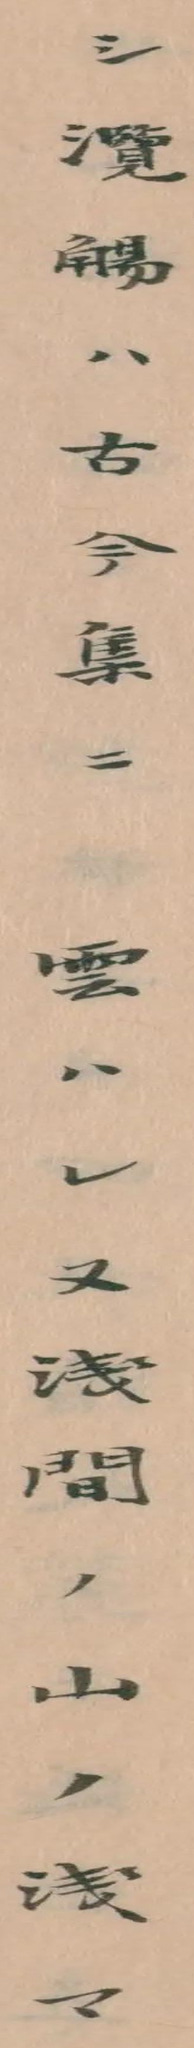シ濫觴ハ古今集二雲ハレヌ浅間ノ山ノ浅マ
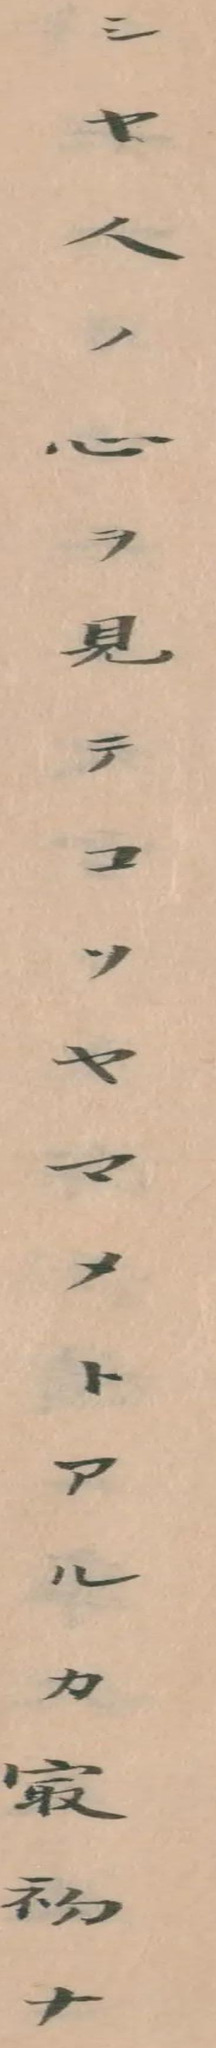ㇱヤ人ノ心ヲ見テコソヤマメトアルカ最初ナ
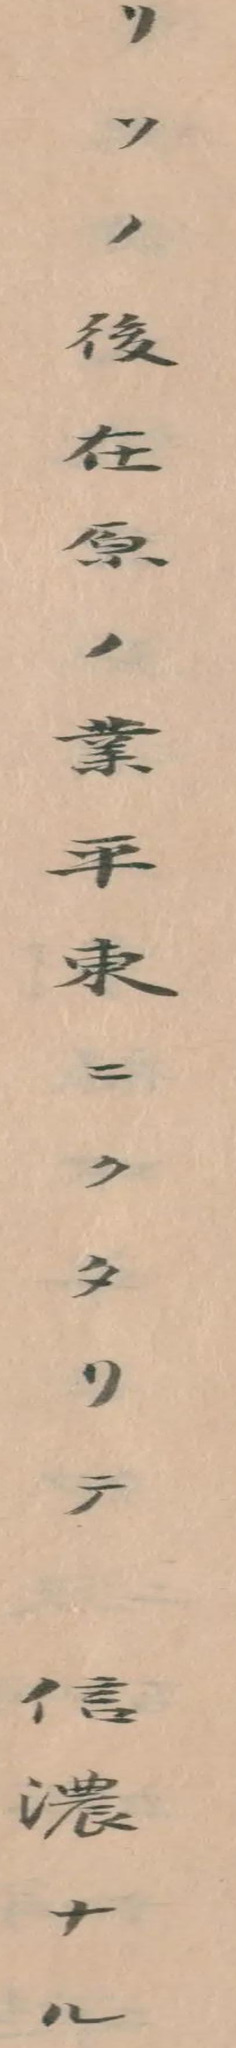リソノ後在原ノ業平東二クタリテ信濃ナル
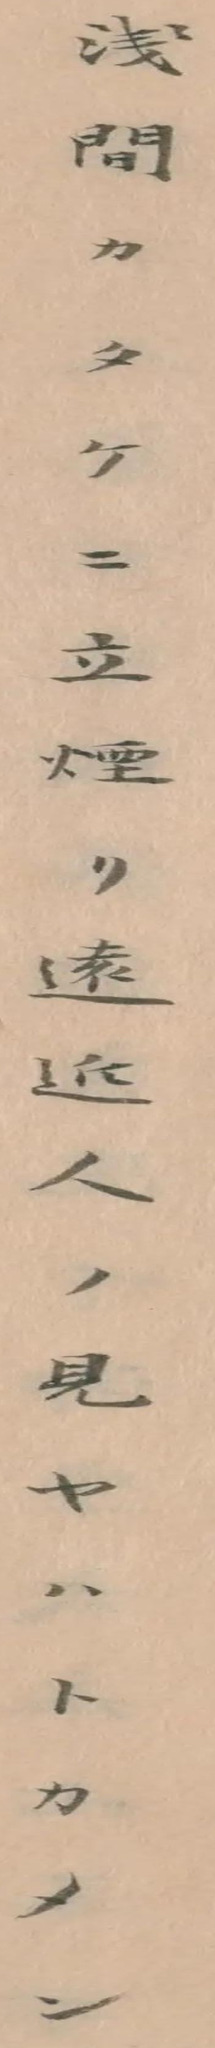浅間カタケ二立煙リ遠近人ノ見ヤハトカメン
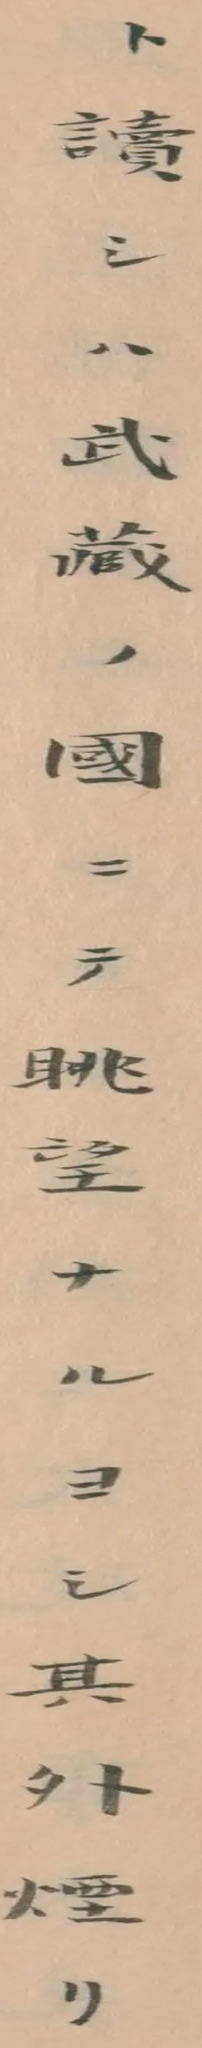ト読シハ武蔵ノ国ニテ眺望ナルヨシ其外煙り

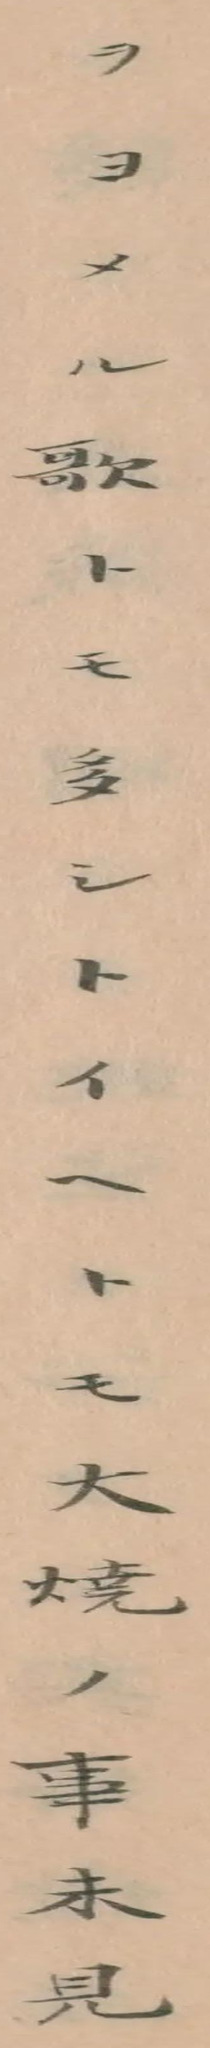ヲヨメル歌トモ多シトイヘトモ大焼ノ事未見
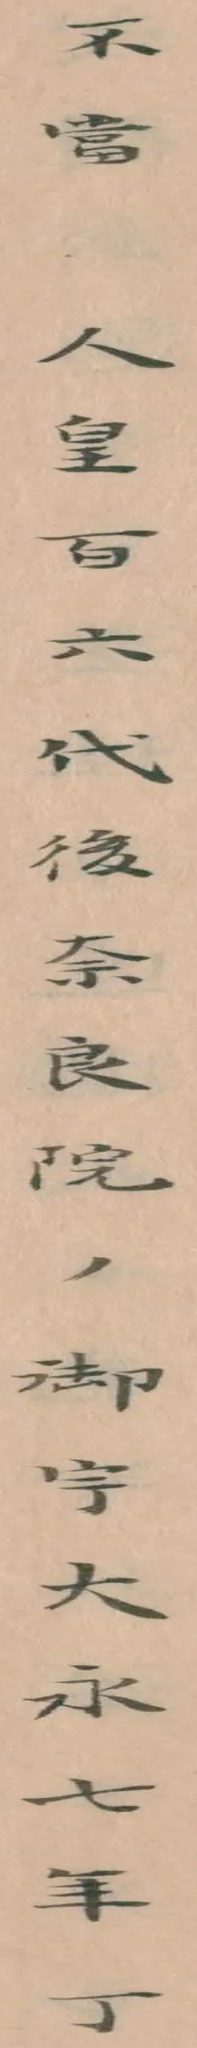不当人皇百六代後奈良院ノ御宇大永七年丁
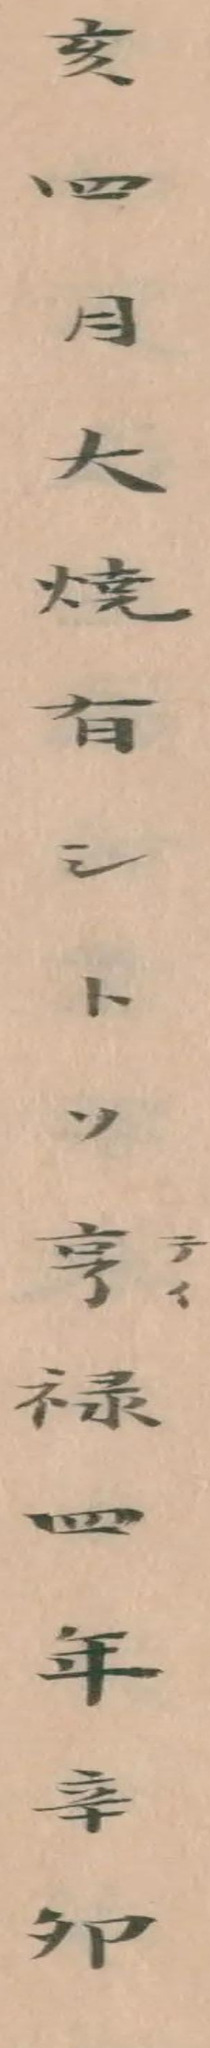亥四月大焼有シトソ亭録四年辛卯
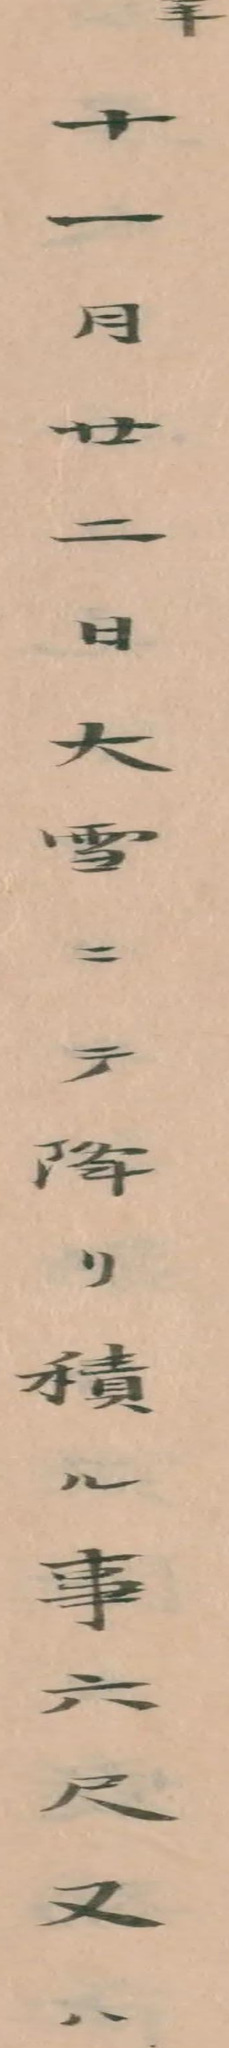年十一月廿二日大雪ニテ降リ積ル事六尺又ハ
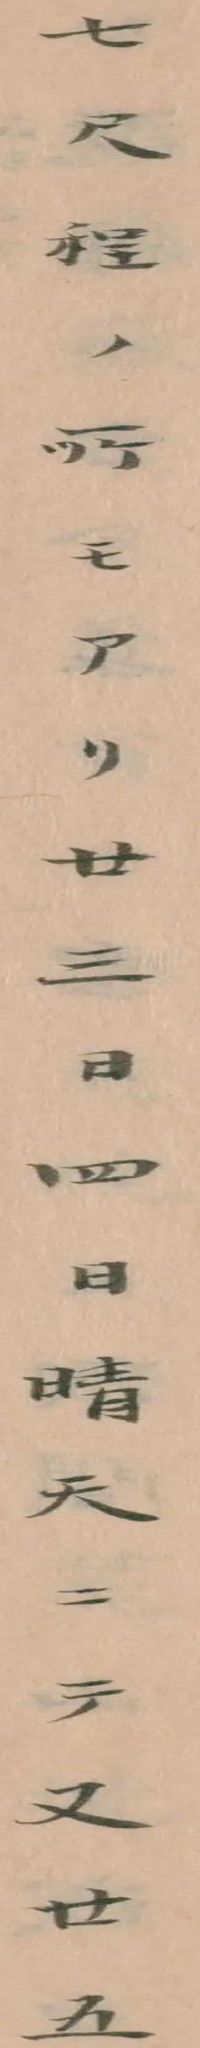七尺程ノ所モアリ廿三日四日晴天ニテ又廿五
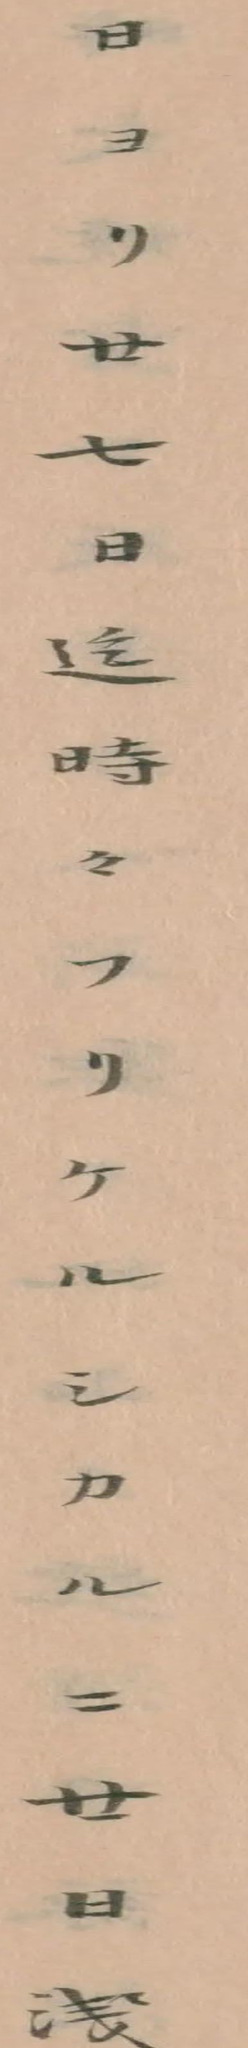日ヨリ廿七日迄時々フリケルシカルニ廿日浅
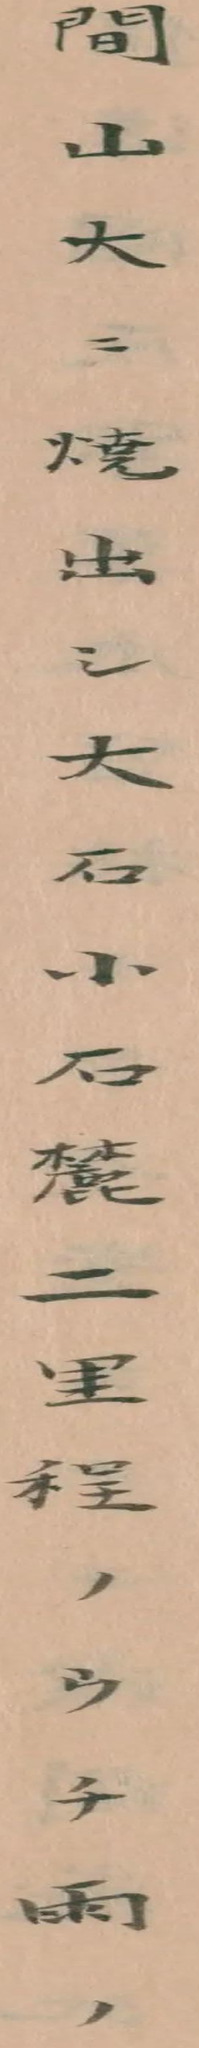間山大二焼出シ大石小石麓二里程ノウチ雨ノ
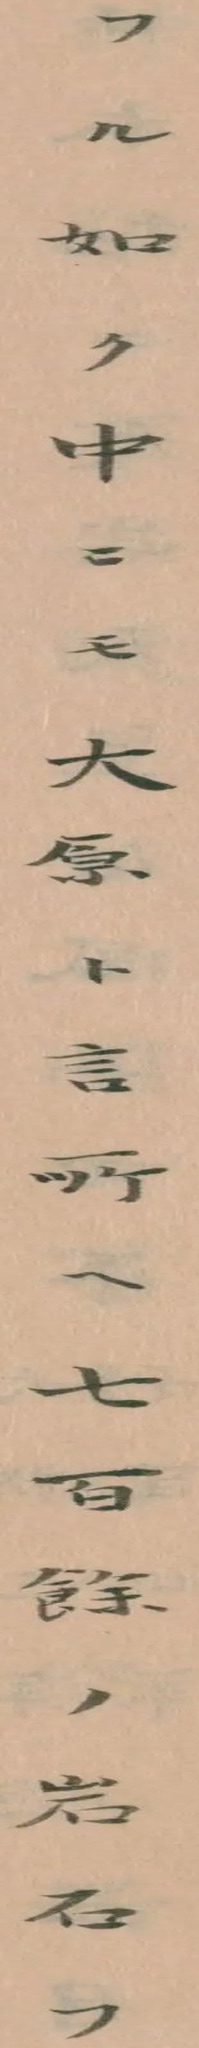フル如ク中二モ大原ト言所へ七百程ノ岩石フ
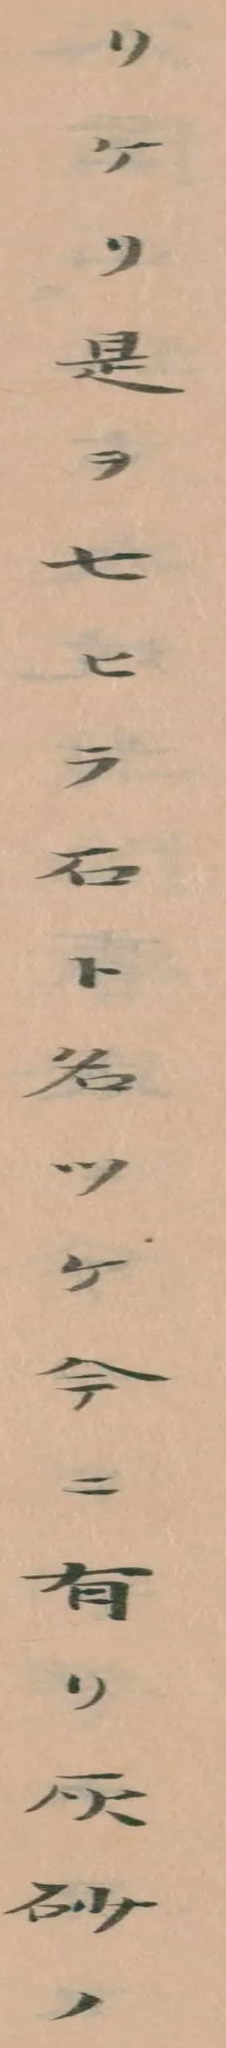リケリ是ヲ七ヒラ石ト名ッヶ今二有リ灰砂ノ
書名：地災撮要. 巻3(地震之部)-巻4(噴火之部)
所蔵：国立国会図書館 National Diet Library, JAPAN
